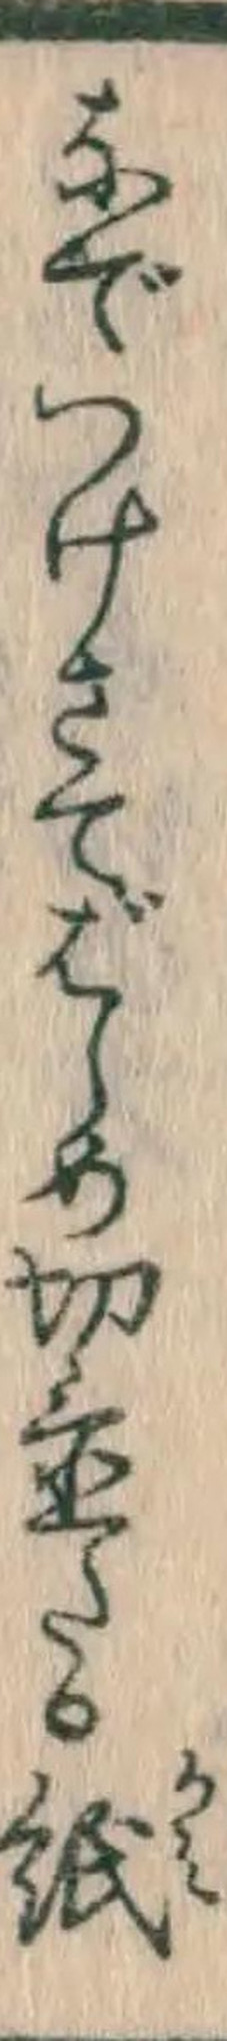なでつけさてばしめ切置たる紙
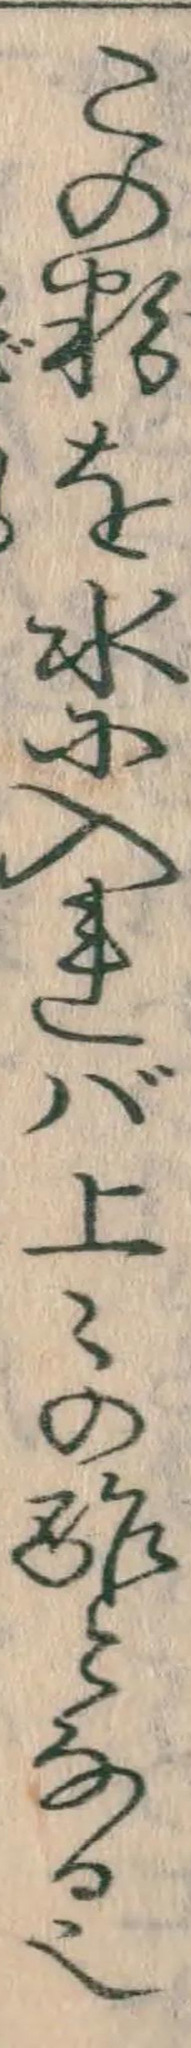この粉を水に入れば上々の酢となる也
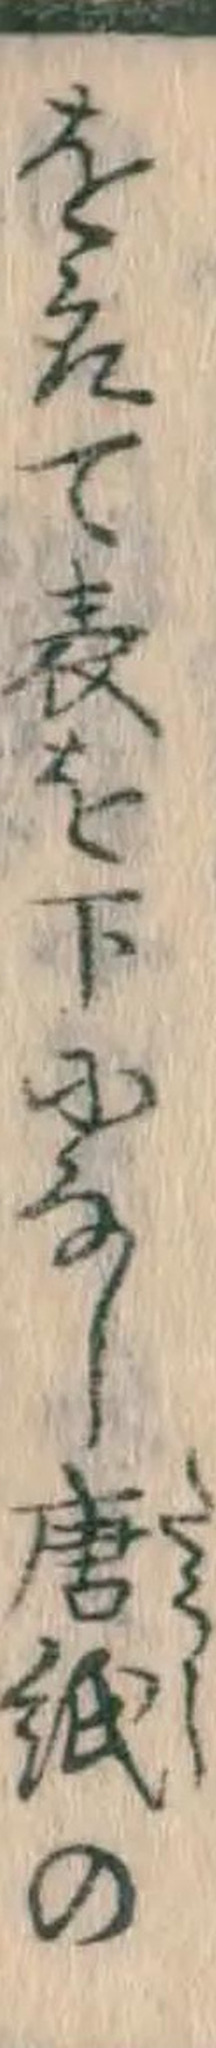を取て表を下になし唐紙の
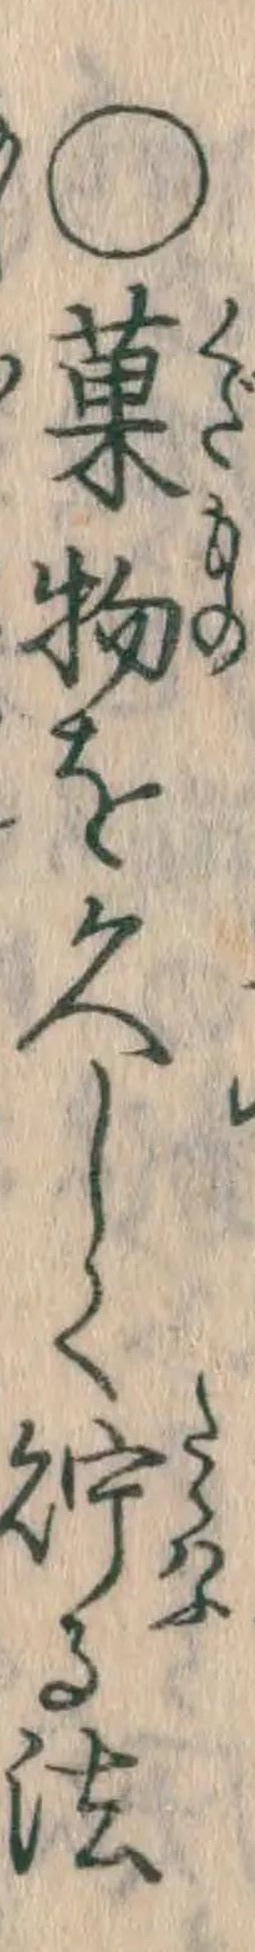○果物を久しく貯る法
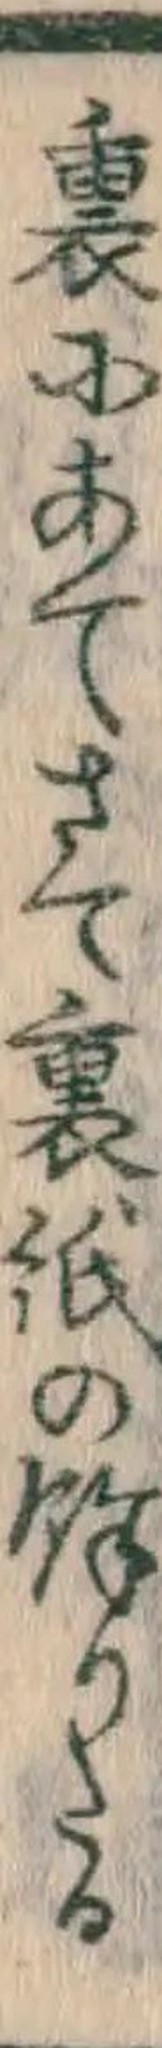裏にあてさて裏紙の余りたる
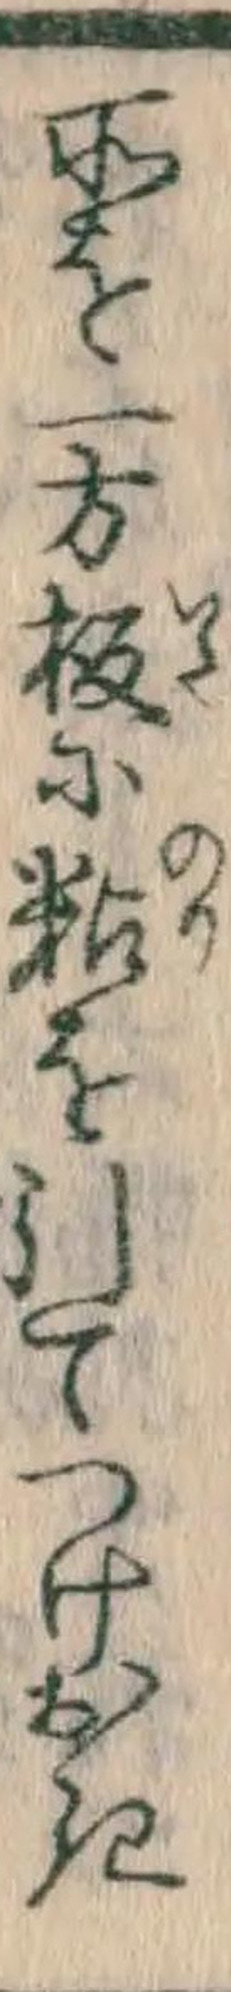所を一方板に粘を引てつけおき
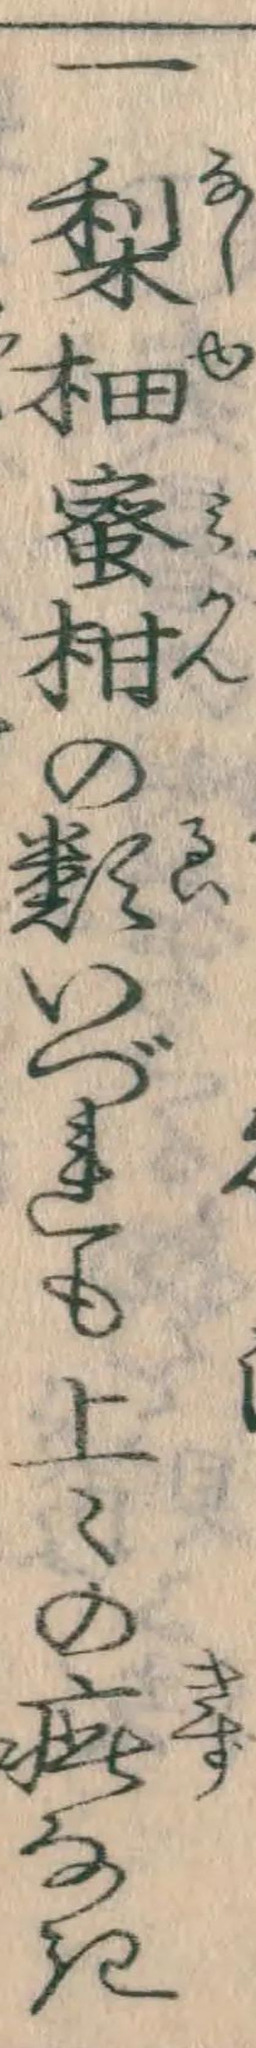一梨柚蜜柑の類いづれも上々の疵なき
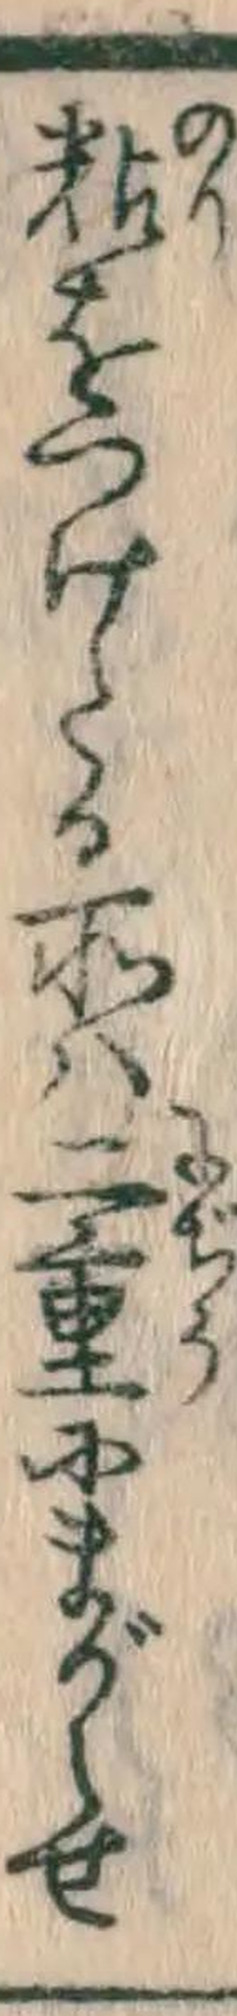粘をつけたる所は二重にまがらせ
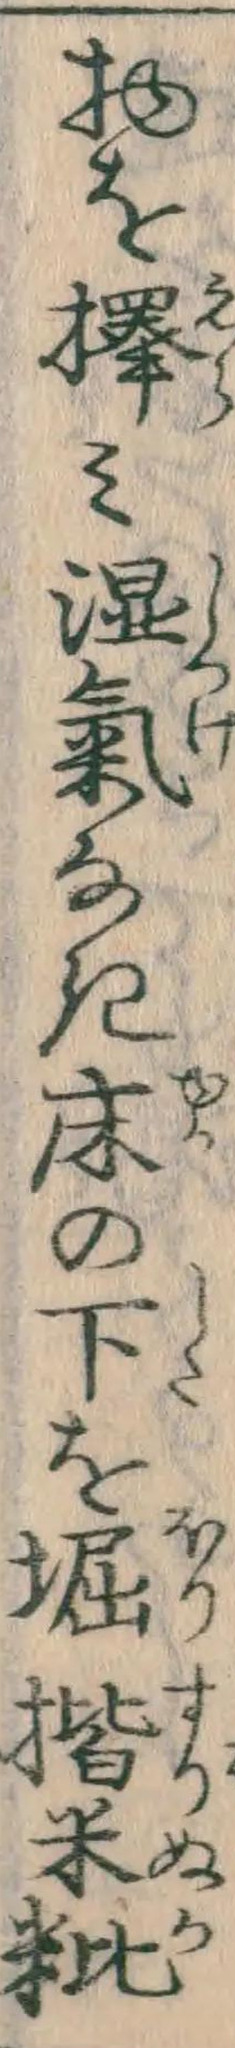物を択み湿気なき床の下を掘摺米粃
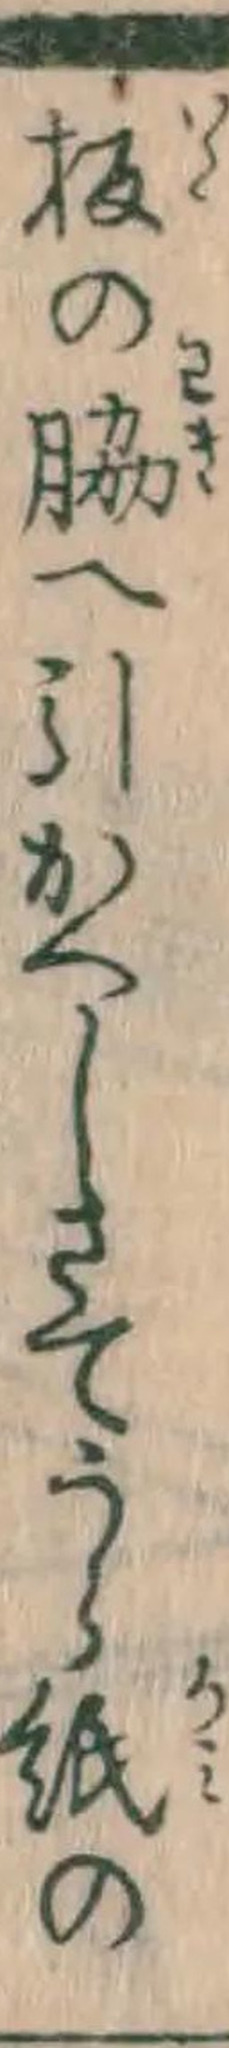板の脇へ引かへしさてうら紙の
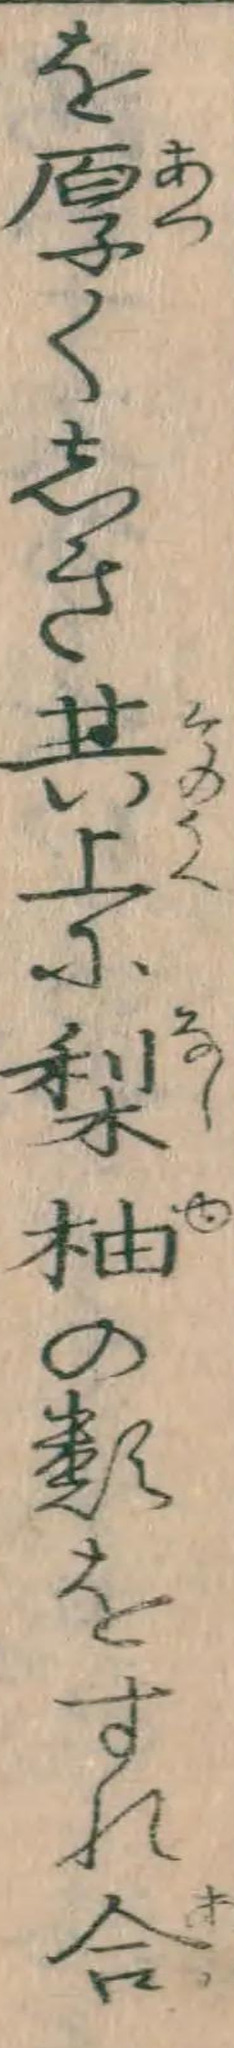を厚くしき其上に梨柚の類をすれ合
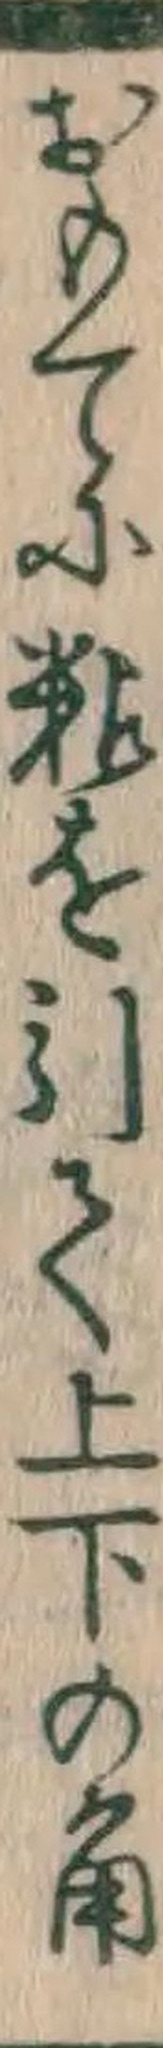おもてに粘を引て上下の角
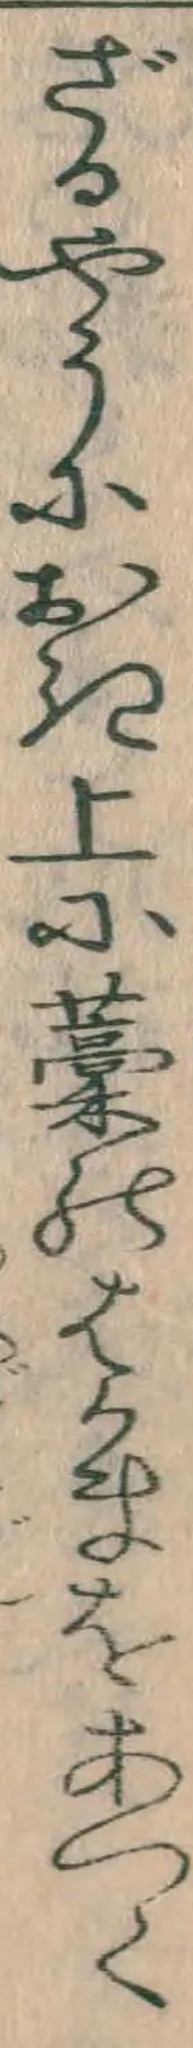ざるやうにおき上に藁のはかまをあつく
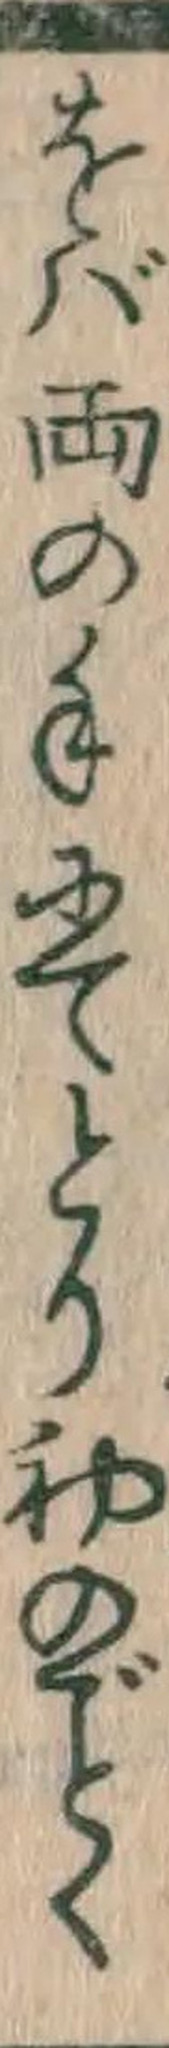をば両の手にてとり初のごとく
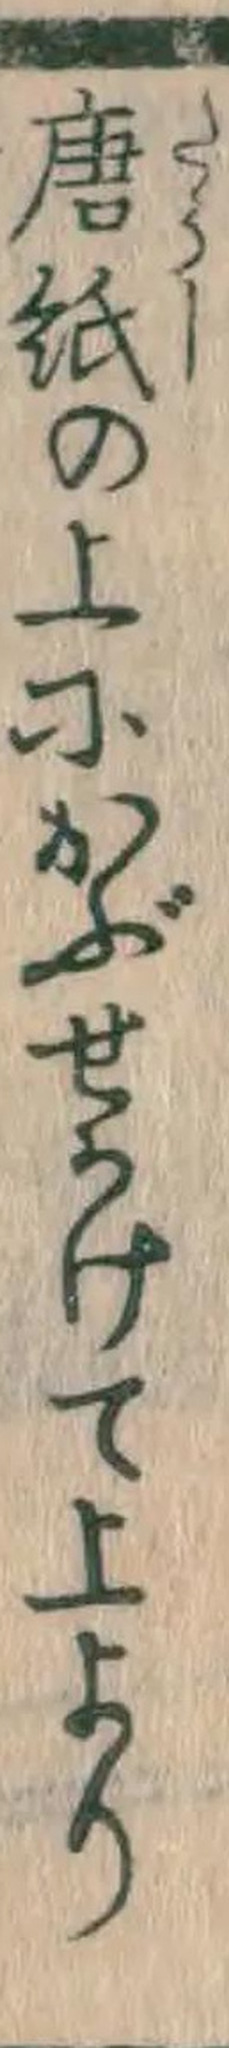唐紙の上にかぶせかけて上より
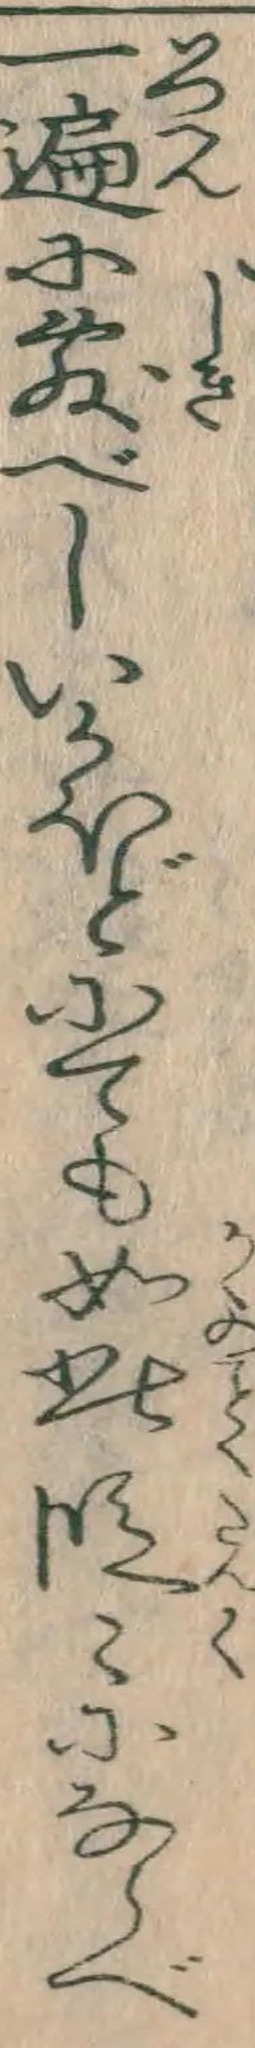一遍に敷べしいかほどにても如此段々にならべ
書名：広益秘事大全 3巻. [2]
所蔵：国立国会図書館 National Diet Library, JAPAN
